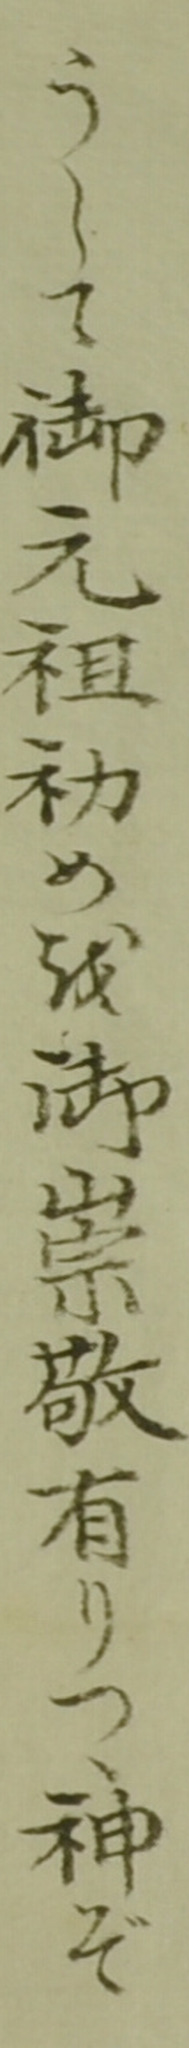うして御元祖初めを御崇敬有りつゝ神ぞ
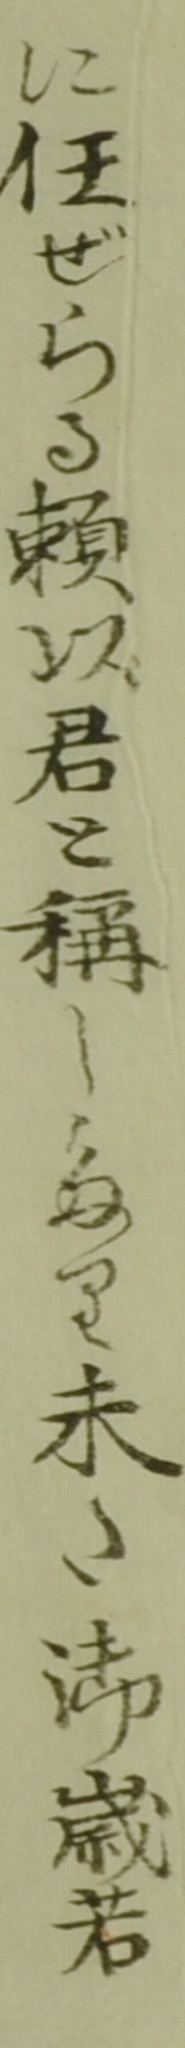に任ぜらる頼以君と称したり未た御歳若
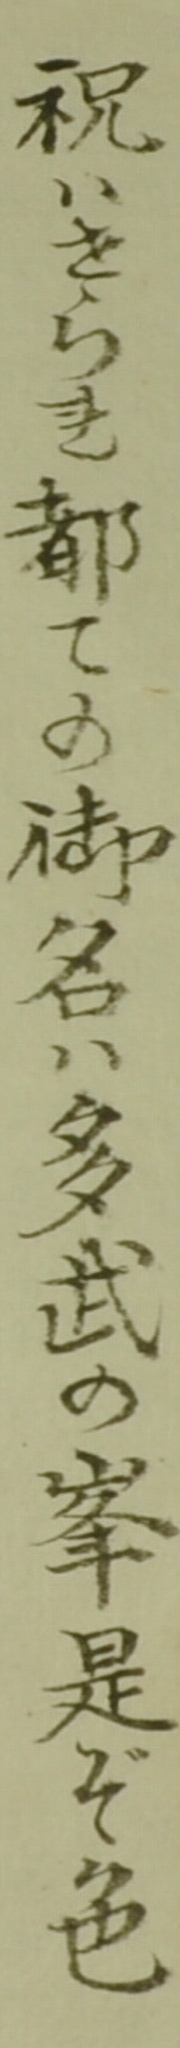祝はせられ都ての御名は多武の峯是ぞ色
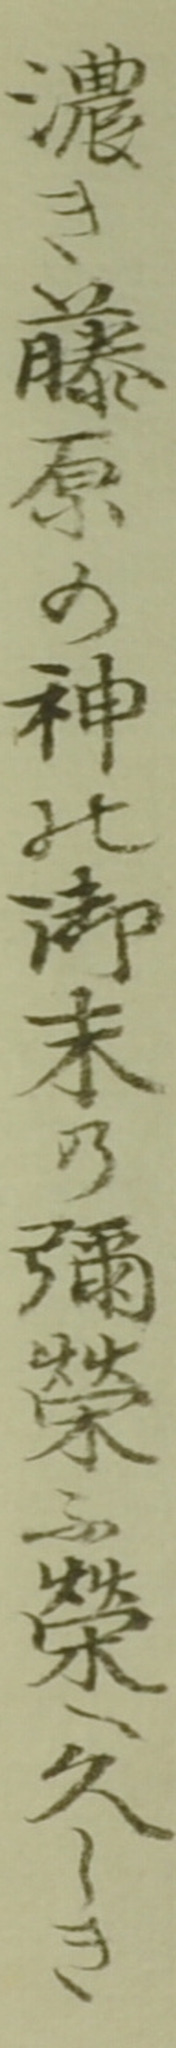濃き藤原の神の御末の弥栄ふ栄へ久しき
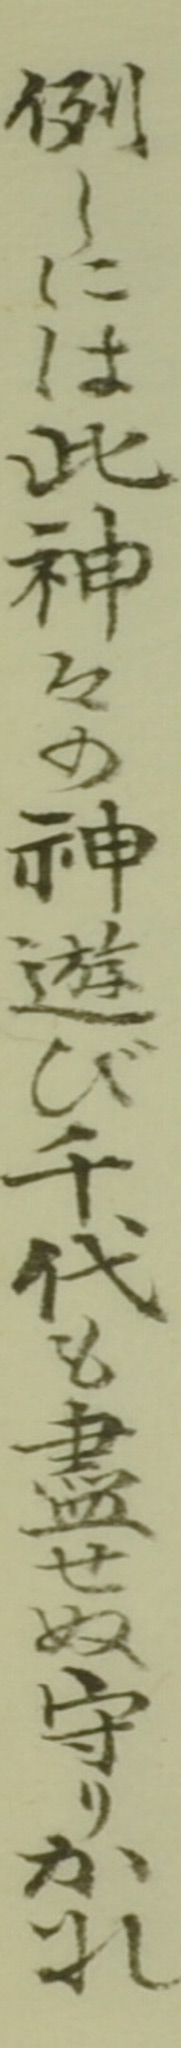例しには此神々の神遊び千代も尽せぬ守りかな
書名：藤葛（全）
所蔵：伊那市立高遠町図書館・合同会社AMANE
